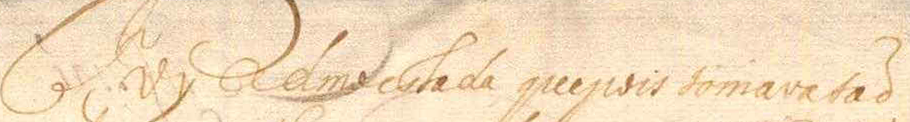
Foy admoestada que pois tomava taõ
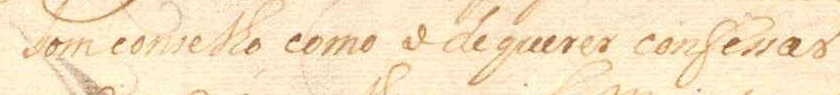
bom conselho como o de querer confessar
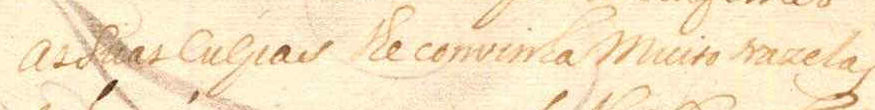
as duas Culpas lhe convinha Muito trazelas
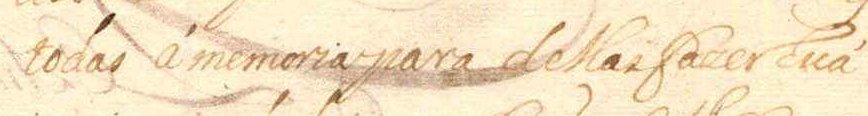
todas a memoria para dellas fazer huā
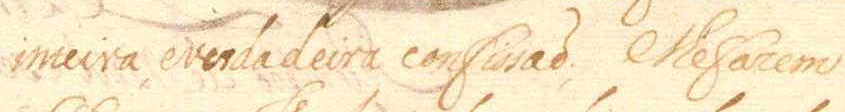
inteira, e verdadeira confissaõ; e lhe fazem
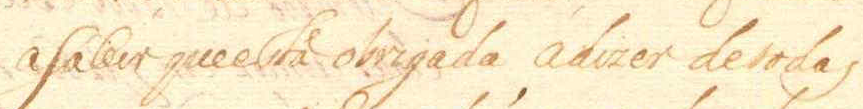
a saber que está obrigada a dizer de todas
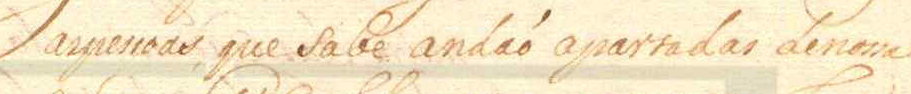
as pessoas, que sabe andaõ apartadas de nossa
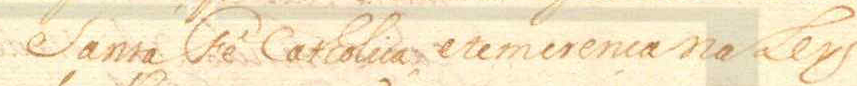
Santa Fé Catholica, e tem crença na Ley
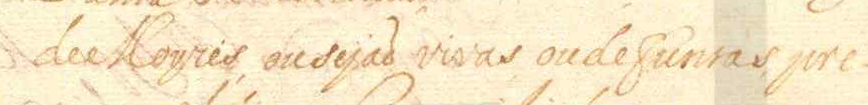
de Moyzés, ou sejaõ vivas ou defuntas pre
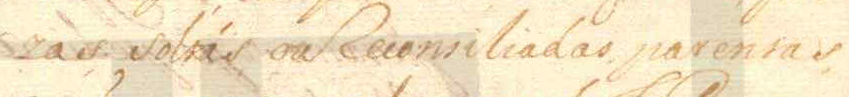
zas, soltás ou Reconsiliadas parentas
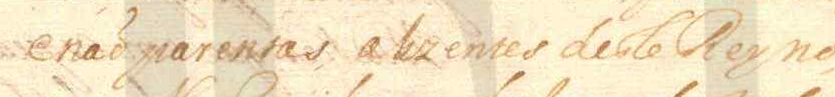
e naõ parentas, abezentes deste Reyno
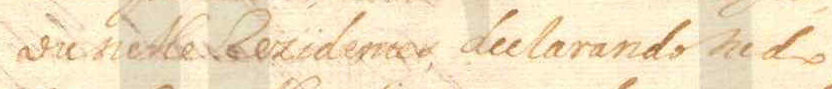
ou nelle Rezidentes, declarando tudo
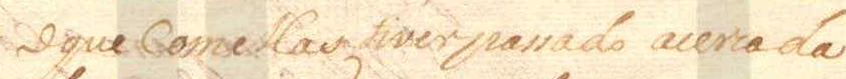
o que com ellas tiver passado acerca da
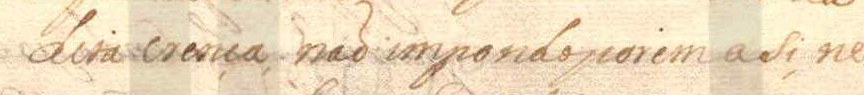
dita crença, naõ impondo porem a si, nē
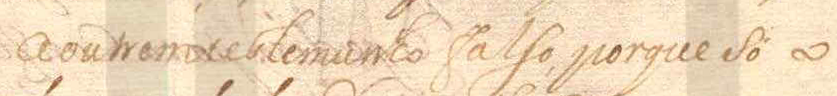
a outrem testemunho falso, porque só a
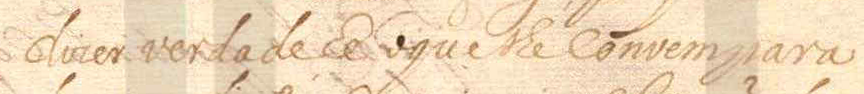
dizer verdade he o que lhe convem para
